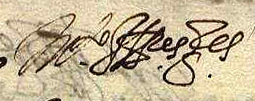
M.to Ill̄.res S.res
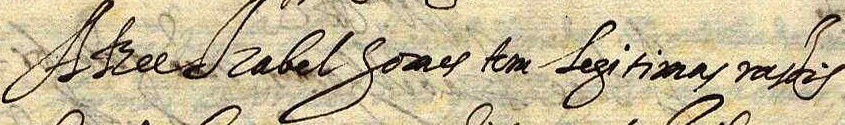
A Ree Izabel Gomes tem Legitimas rasõis
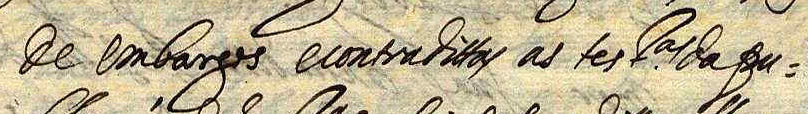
de embargos e contradittas as test.as da pu
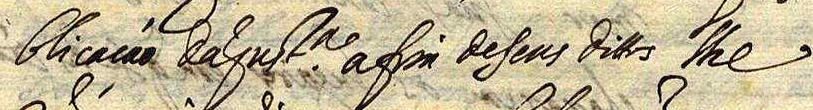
blicaçaõ da just.a a fim de seus dittos lhe
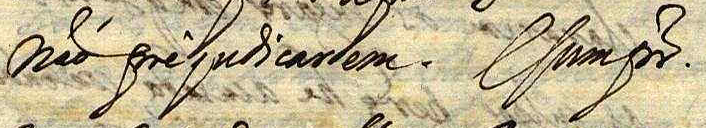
naõ prejudicarem. E Cumpr̄.
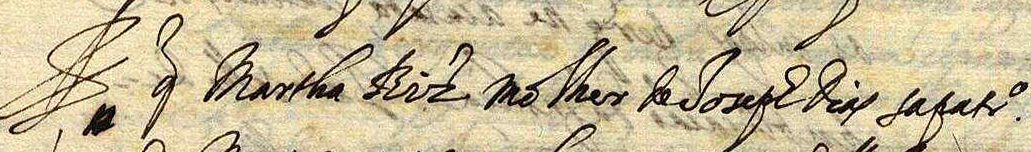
Ꝓ 1 2 q̄ Martha Riz̄ molher de Joseph Dias sapatr.o
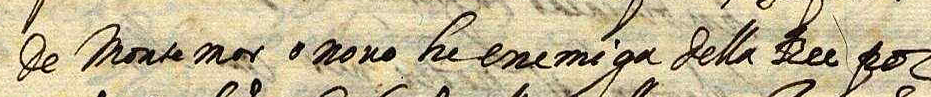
de Montemor o nouo he enemiga della Ree por
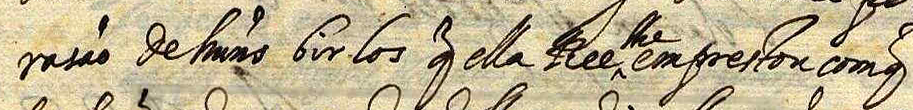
rasaõ de hun̄s birlos q̄ ella Ree lhe emprestou com q̄
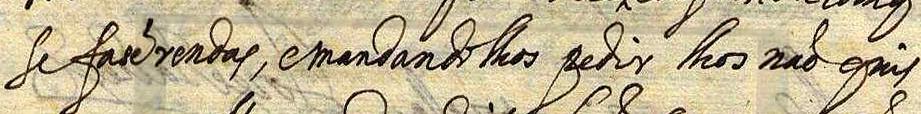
se fasē rendas, e mandandolhos pedir lhos naõ quis
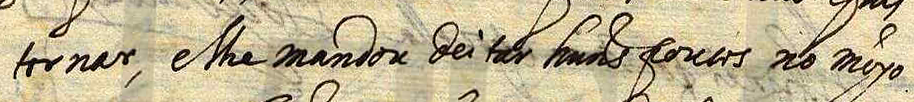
tornar, e lhe mandou deitar hun̄s poucos no meyo
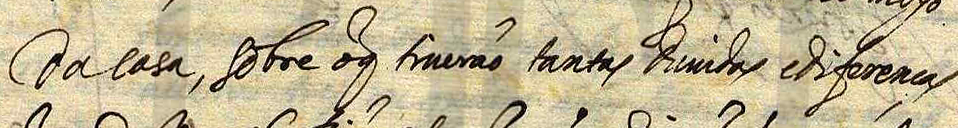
da casa, sobre o q̄ tiueraõ tantas duuidas e diferenças
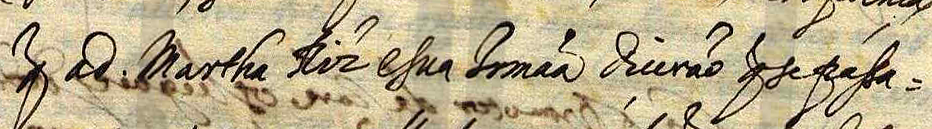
q̄ a d. Martha Riz̄ e sua Irmaā diceraõ q̄ se passa
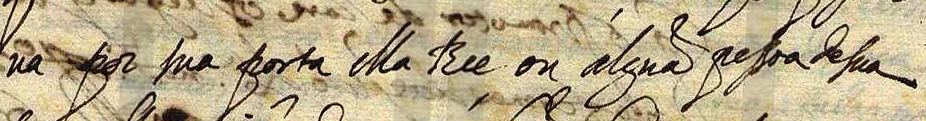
ua por sua porta ella Ree, ou alguā pessoa de sua
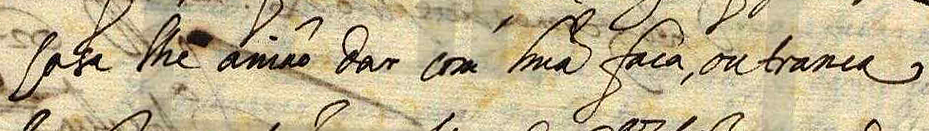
Casa lhe auiaõ dar com huā faca, ou tranca
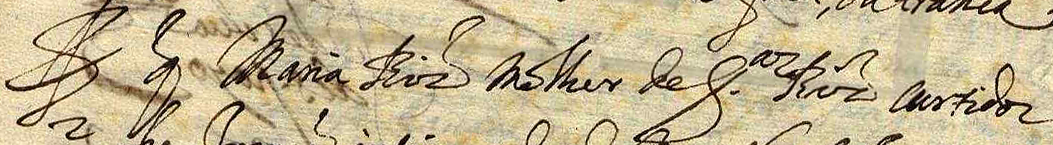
Ꝓ 2 q̄ Maria Riz̄ molher de G.ar Riz̄ curtidor
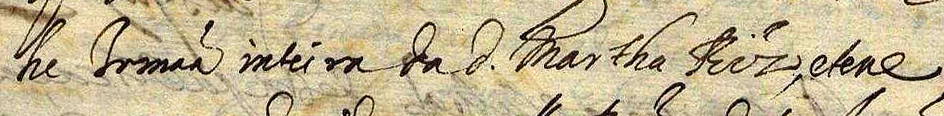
he Irmaã inteira da d. Martha Riz̄, e teue
